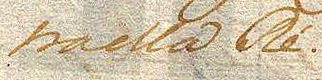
tra ella Ré.
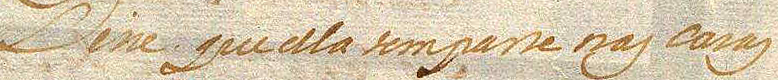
Disse que ella tem parte nas cazas
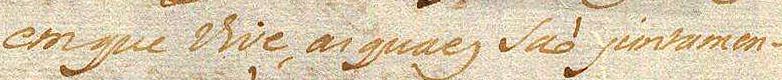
em que vive, as quaes saõ juntamen
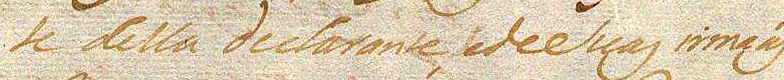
te della declarante, e de suas irmaãs
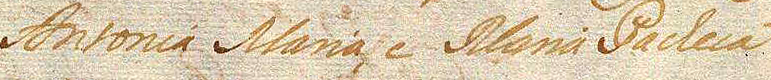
Antonia Maria, e Maria Pacheca
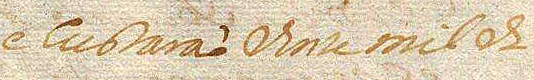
e custaraõ vinte mil rs
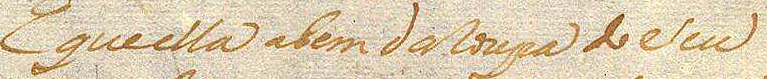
E que ella alem da roupa de seu
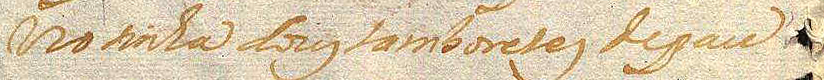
uzo tinha dous tamboretes de pau
